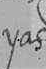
yas
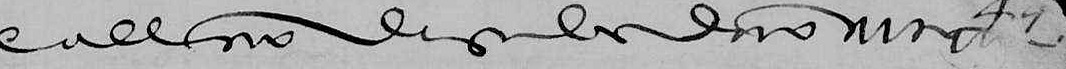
e all n̄o dise dos ditos artyguos
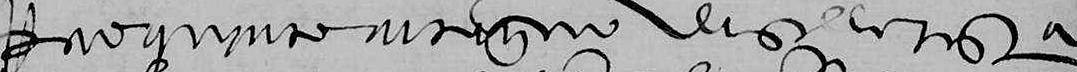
item ao quynto artyguo dis elle testa
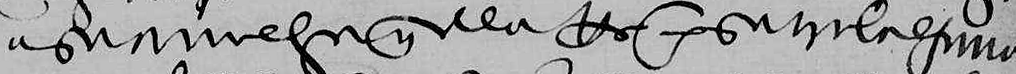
a sua molher q̄ ella Re p̄sa trabalhaua
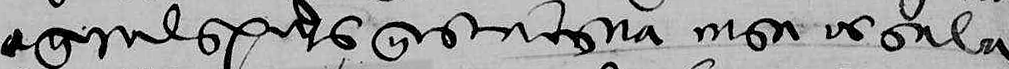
agora despoys q̄ esta ē sua casa os saba
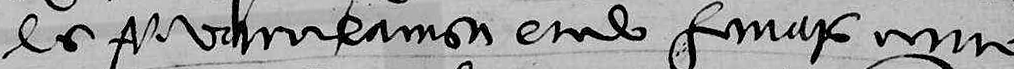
dos .ss. varrer e a casa e todo ho majs como
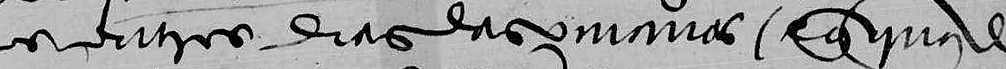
os outros dias da somanas / e q̄ quādo
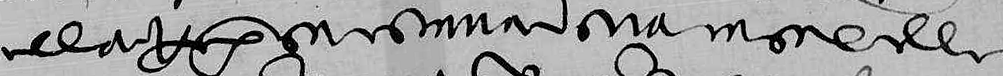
ella Re p̄sa estaua ē sua casa e elle
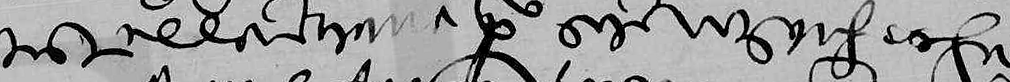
testa lla ētraua p̄o serē vezinhos ha
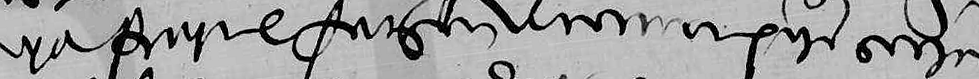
vya ꞩujr e fazer de comer porē se erā
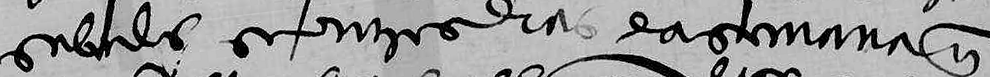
sabados se outros dias da somana q̄
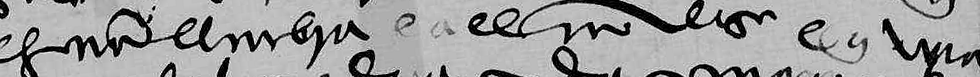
lhe nā llenbra e all nō dise e q̄ vyra
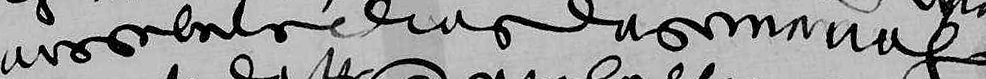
aos sabados e dias da somana ho
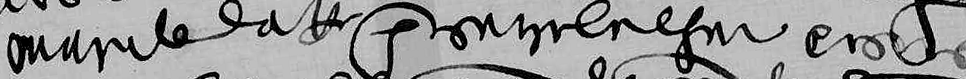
marydo da Re p̄sa trabalhar e eseus
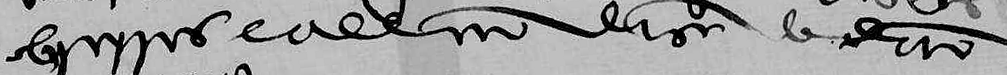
obreyros e all nō dise do dito
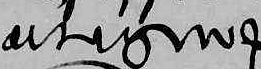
artyguo
